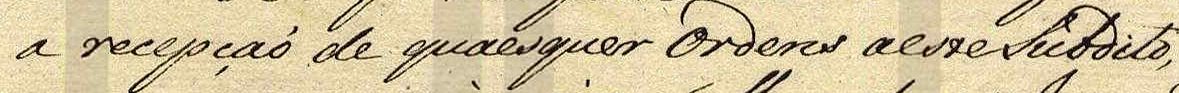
a recepçaõ de quaesquer ordens a este Subdito,
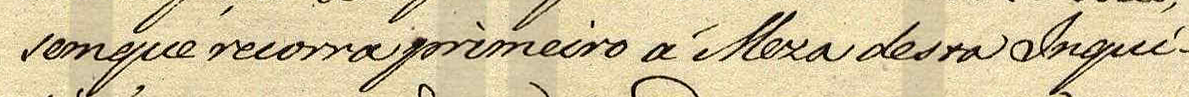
sem que recorra primeiro á Meza desta Inqui
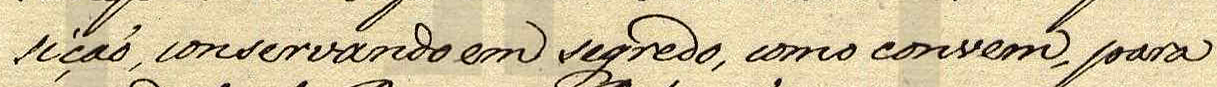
siçaõ, conservando em segredo, como convem, para
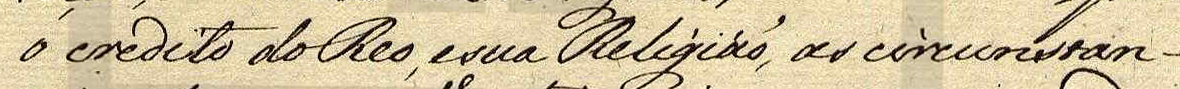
o credito do Reo, e sua Religiaõ, as circunstan
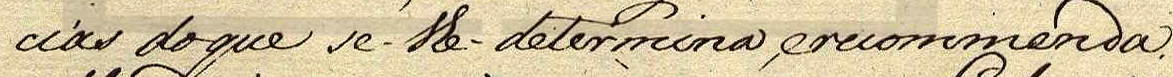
cias do que se-lhe determina, e recommenda.
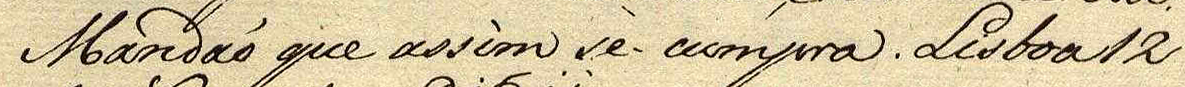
Mandaõ que assim se cumpra. Lisboa 12
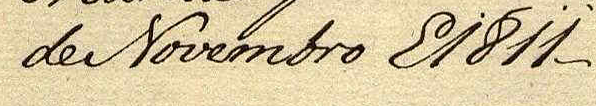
de Novembro d̄ i8ii-
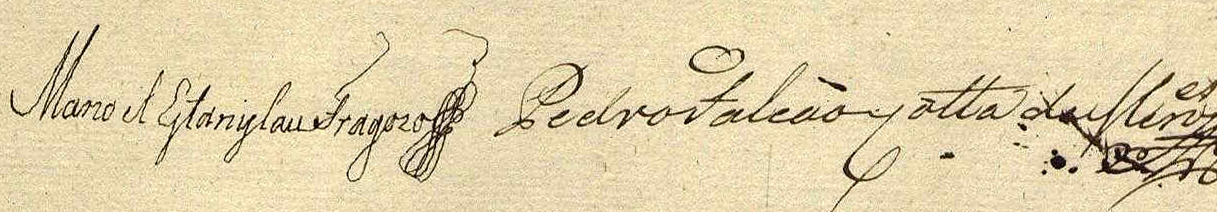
Manoel Estanislau Fragozo Pedro Falcaõ Cotta de Menz.es
